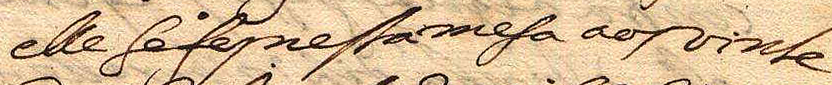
elle se fez nesta mesa aos vinte
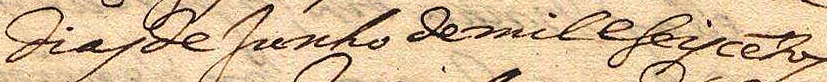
dias de Junho de mil e seisçētos
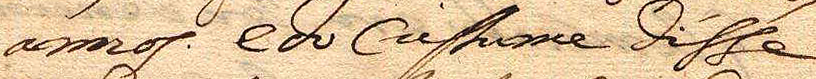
annos. e do custume disse
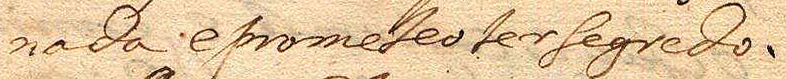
nada e prometeo ter segredo.
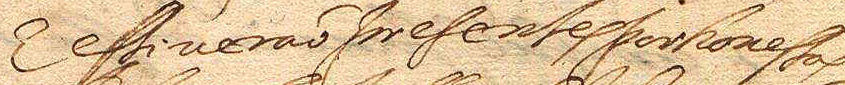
E estiueraõ presentes por honestas
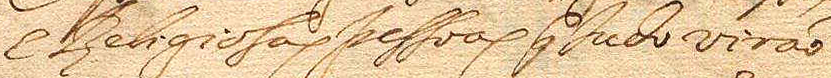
E Religiosas pessoas q̄ tudo viraõ
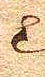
E
